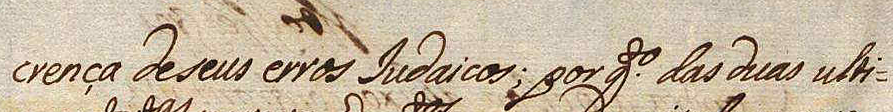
crença de seus erros Iudaicos; porq.to das duas ulti
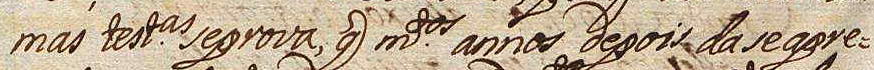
mas test.as se prova, q̄ m.tos annos depois da se apre
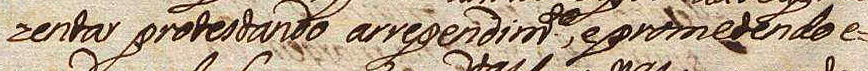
zentar protestando arrependim.to, e prometendo e
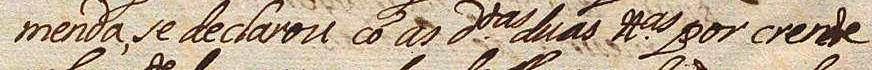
menda, se declarou cō as d.tas duas tt.as por crente
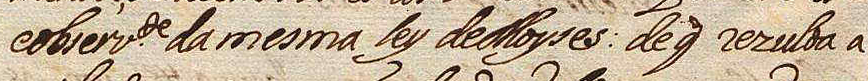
e observ.te da mesma ley de Moyses: de q̄ Rezulta a
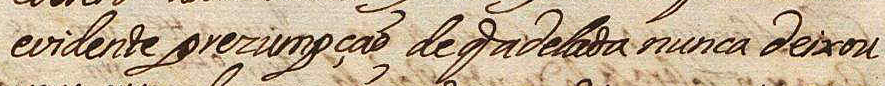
evidente prezumpçaõ de q̄ a delata nunca deixou
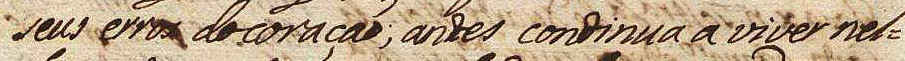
seus erros do coraçaõ; antes continua a viver nel
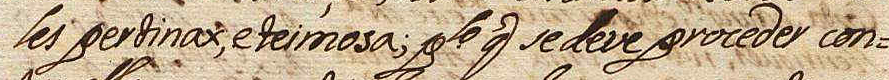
les pertinax, e teimosa; p.lo q̄ se deve proceder con
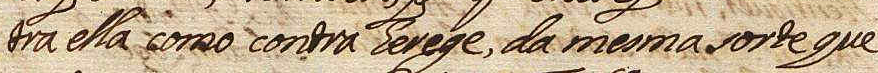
tra ella como contra herege, da mesma sorte que
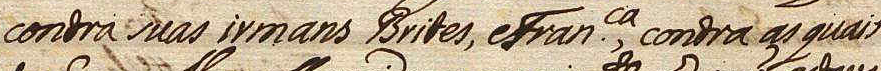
contra suas irmans Brites, e Fran.ca, contra as quais
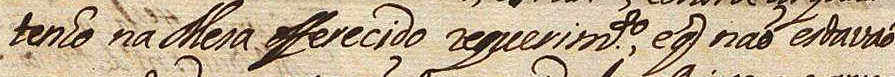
tenho na Mesa offerecido requerim.to, e q̄ naõ estavaõ
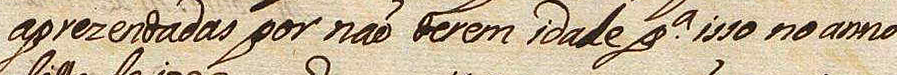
aprezentadas por naõ terem idade p.a isso no anno
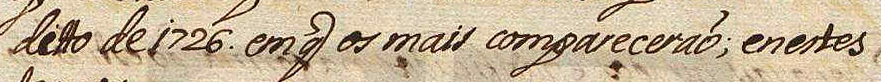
ditto de i726. em q̄ os mais compareçeraõ; e nestes
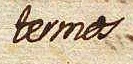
termos
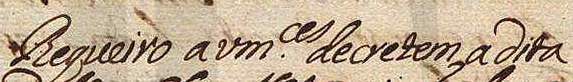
Requeiro a v m.ces decretem a dita
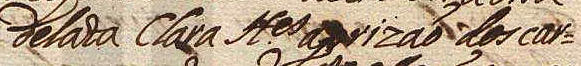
delata Clara H.es a prizaõ dos car
